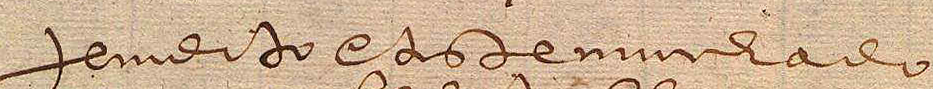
tem dito e testemunhado
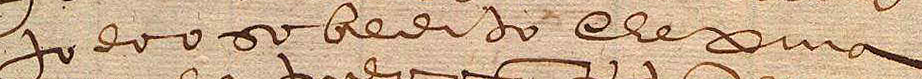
todo o sobredito e he pura
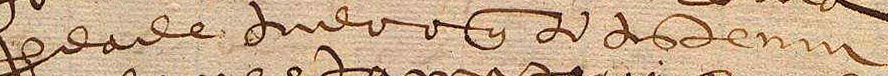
ꝟdade tudo o q̄ tē testemu
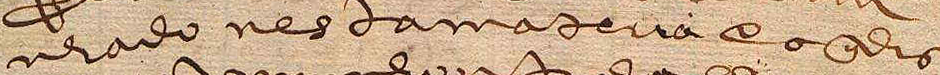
nhado nesta materia e o q̄ dise
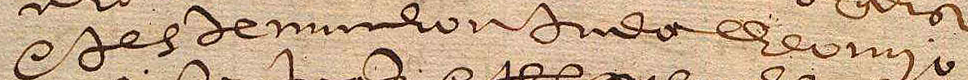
e testemunhou tudo lhe ouujo
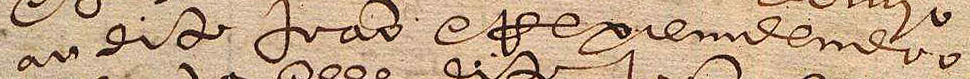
ao dito Joaõ e Repremdendoo
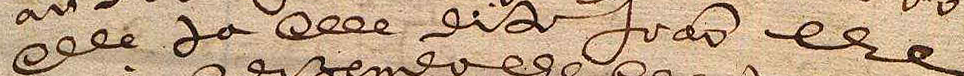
elle ta elle dito Joaõ lhe
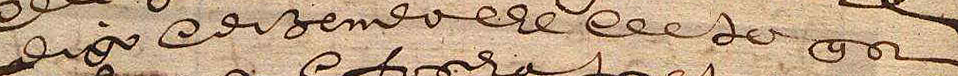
digo e dizemdolhe ele ta q̄ se
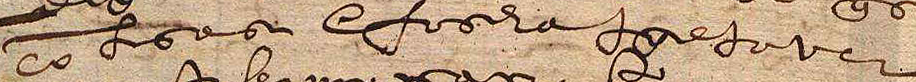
cōfesase e fose ha IgreIa ver
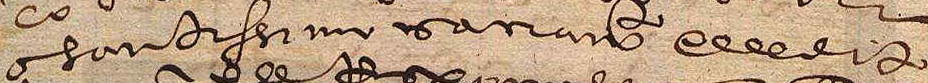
o santissimo sacramto elle dito
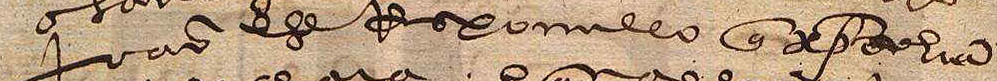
Joaõ lhe Respomdeo q̄ xp̄o huā
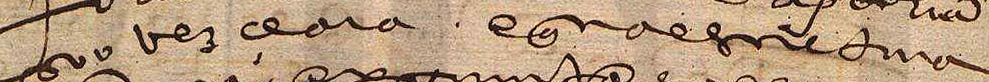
soo vez ceara. e q nao estava
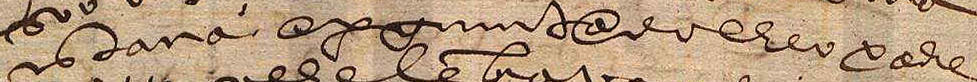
estaua e ꝑgumtādolhe o padre
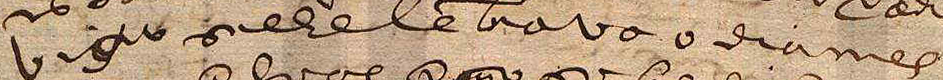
vigro se lhe lēbrava o dia mes
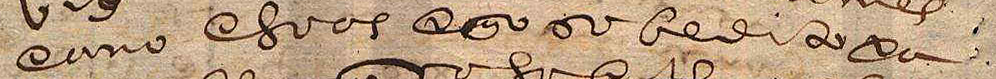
e ano e soas ē q̄ o sobredito pa
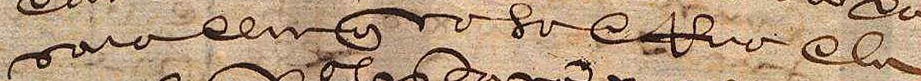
sara e em q̄ casa e Rua e lu
